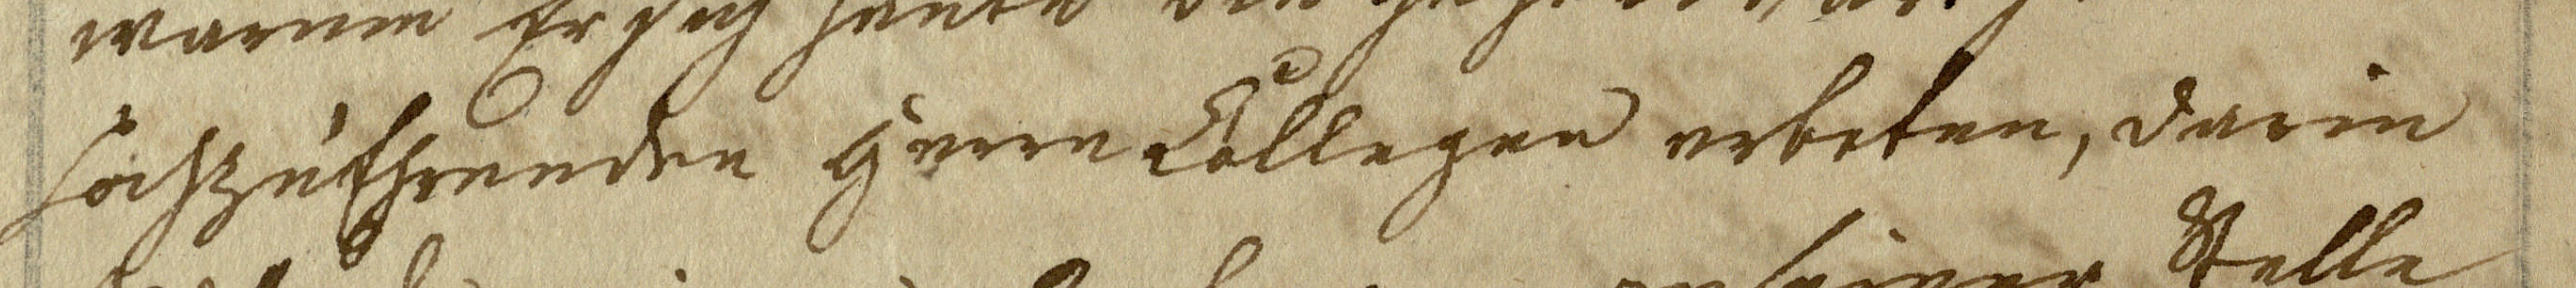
hochzuEhrenden Herrn Collegen erbeten, darin
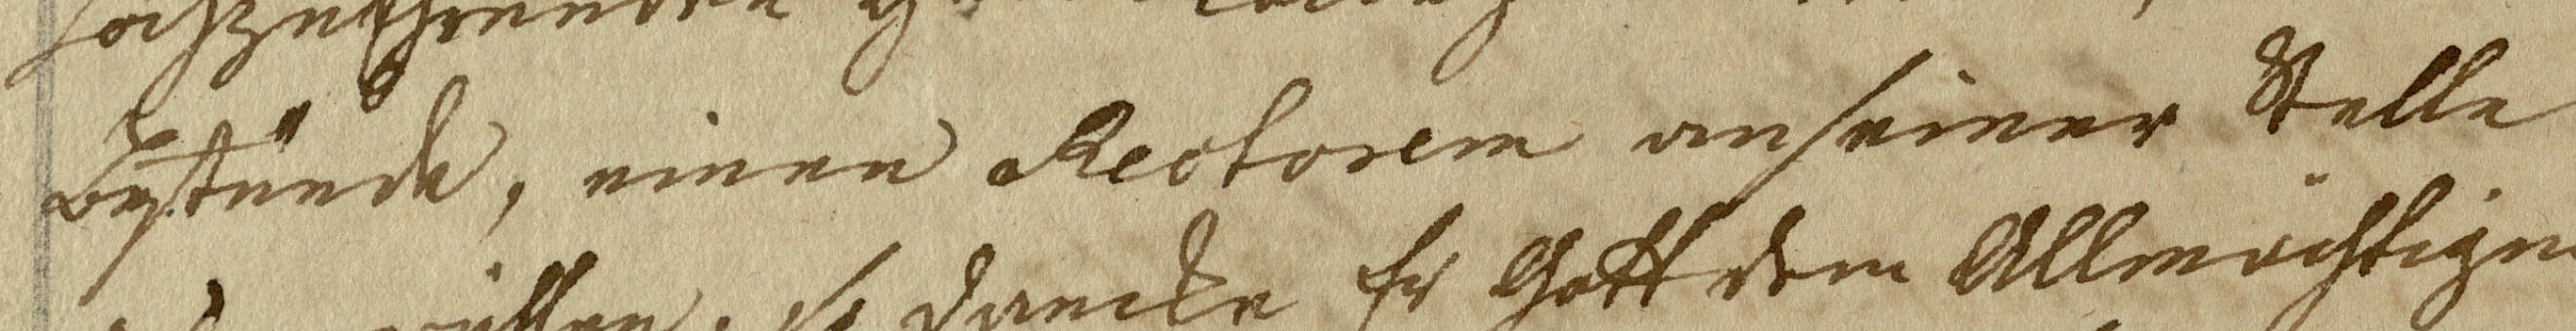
bestünde, einen Rectorem an seiner Stelle
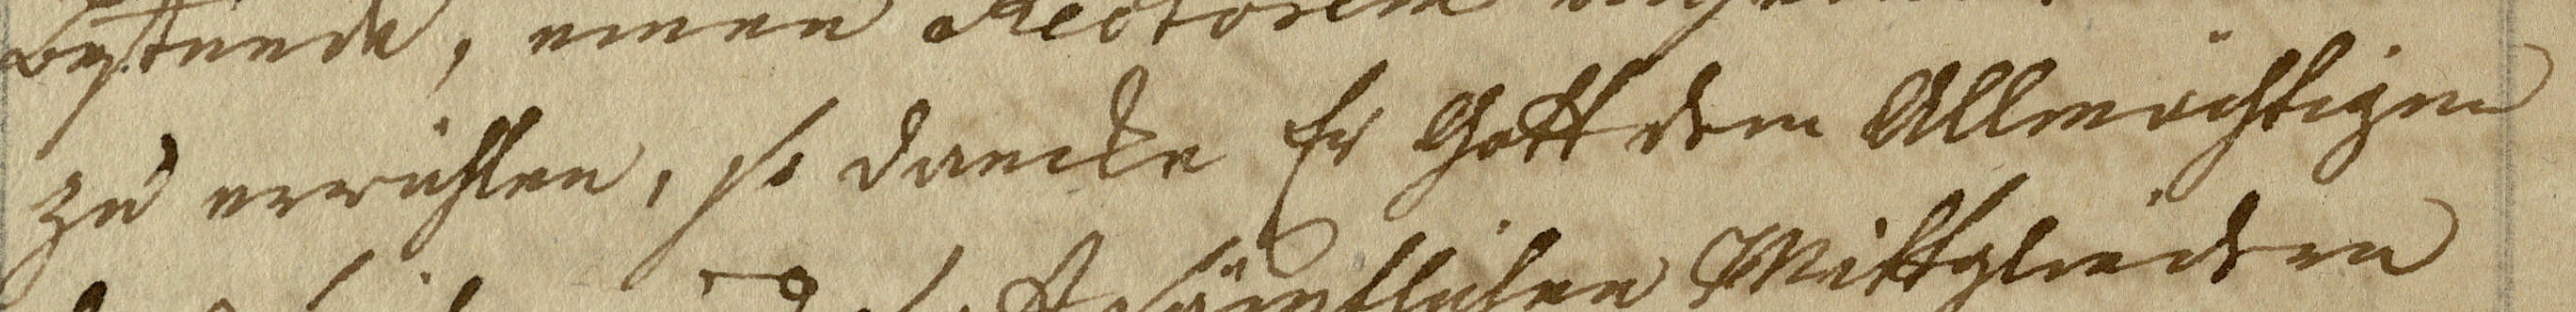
zu erwählen, so dancke Er Gott dem Allmächtigen
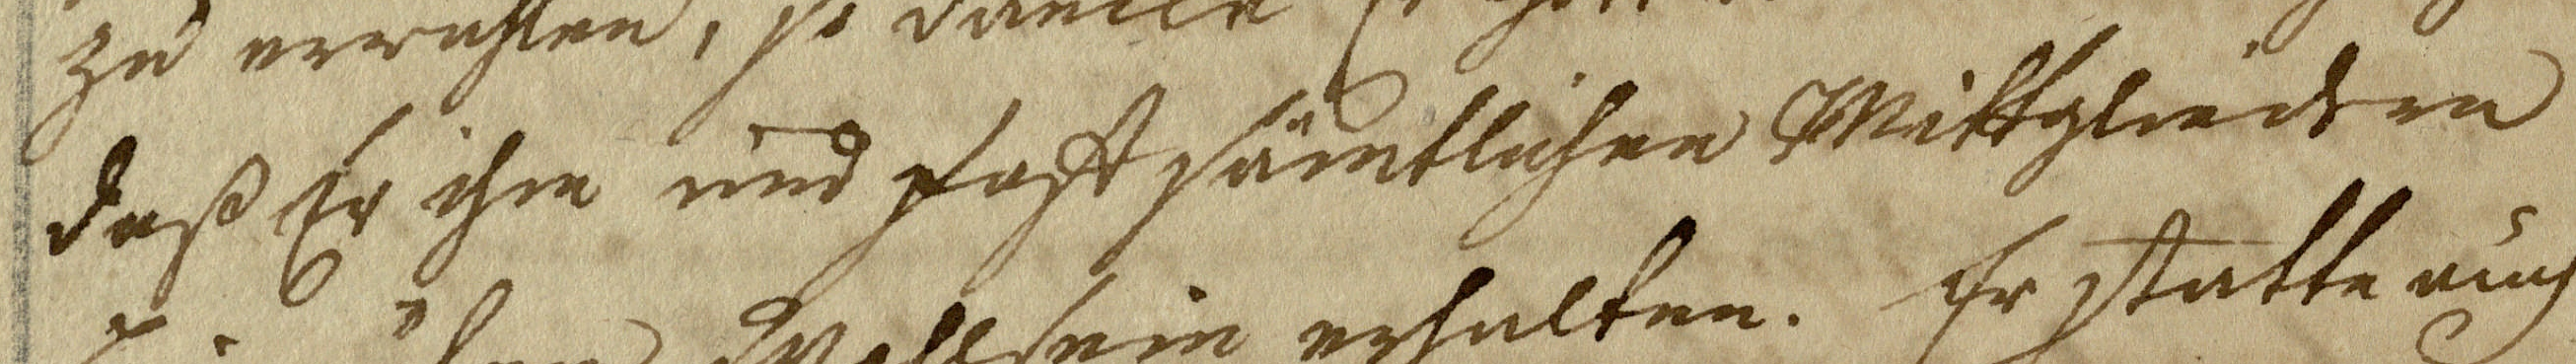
daß Er ihm und fast sämtlichen Mittgliedern
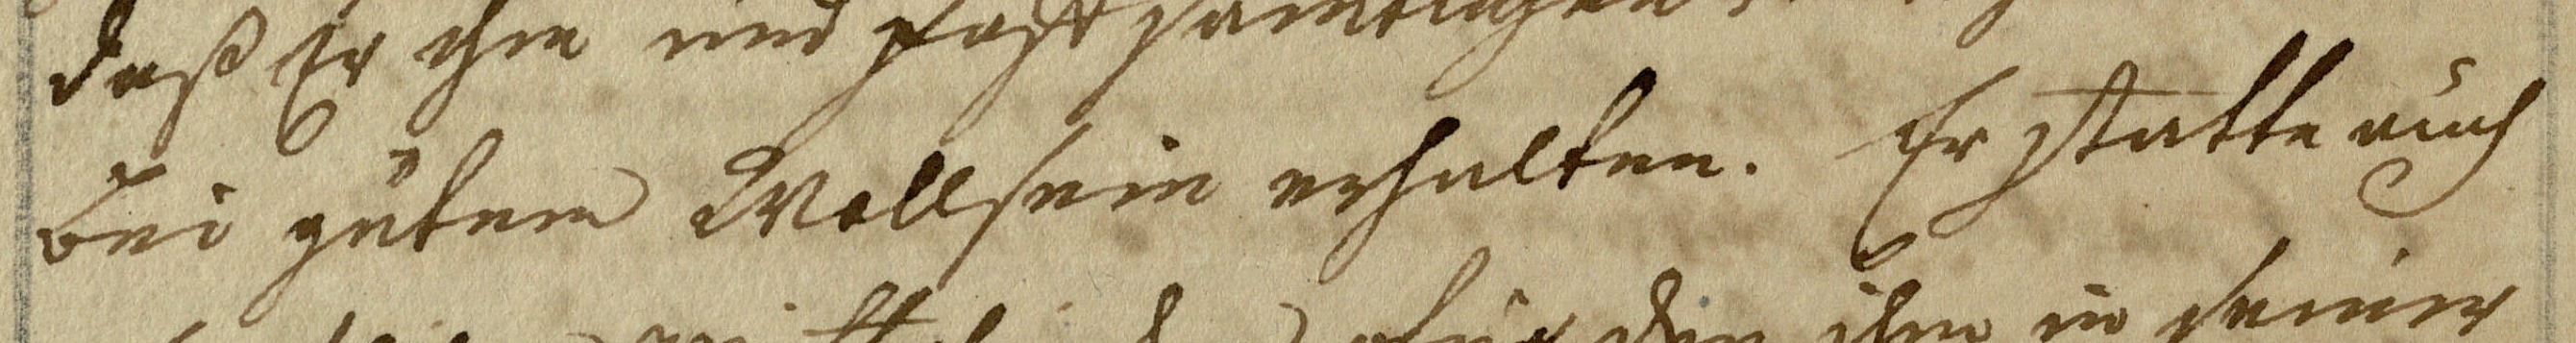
bei gutem Wollsein erhalten. Er statte auch
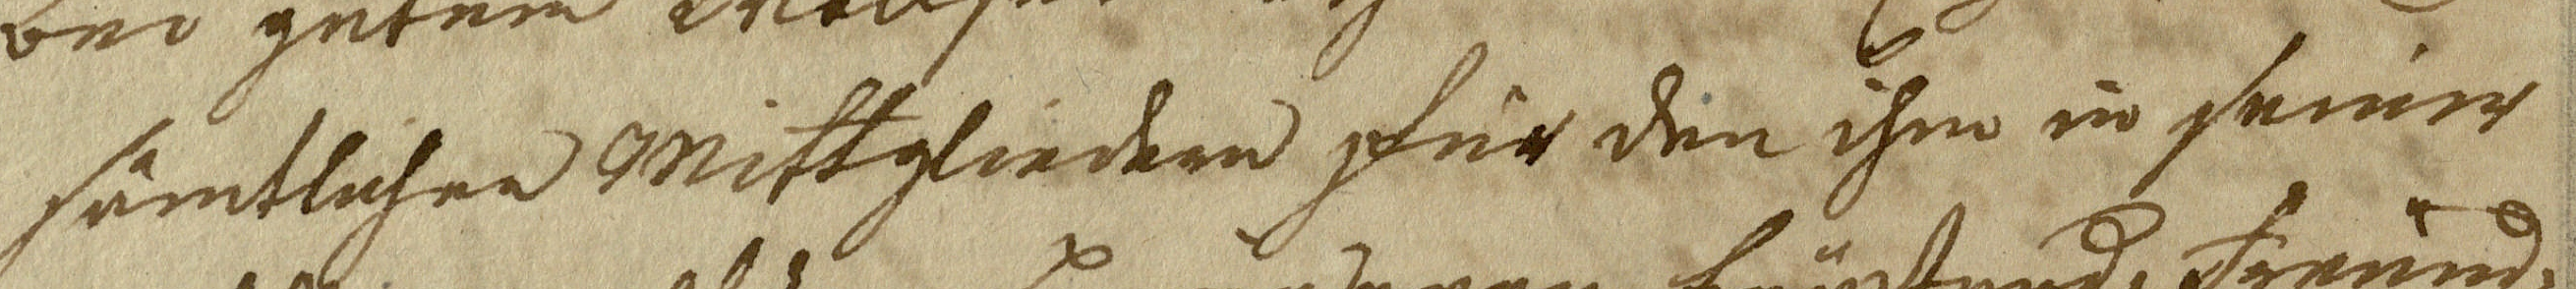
sämtlichen Mittgliedern für den ihm in seiner
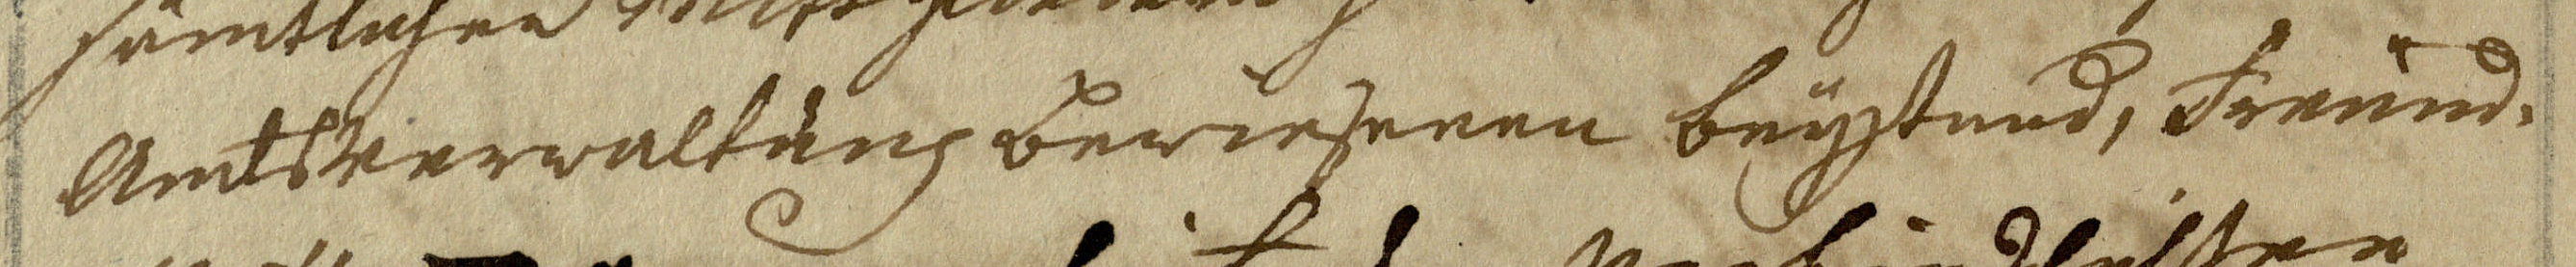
Amtsverwaltung bewiesenen Beÿstand, Freund¬
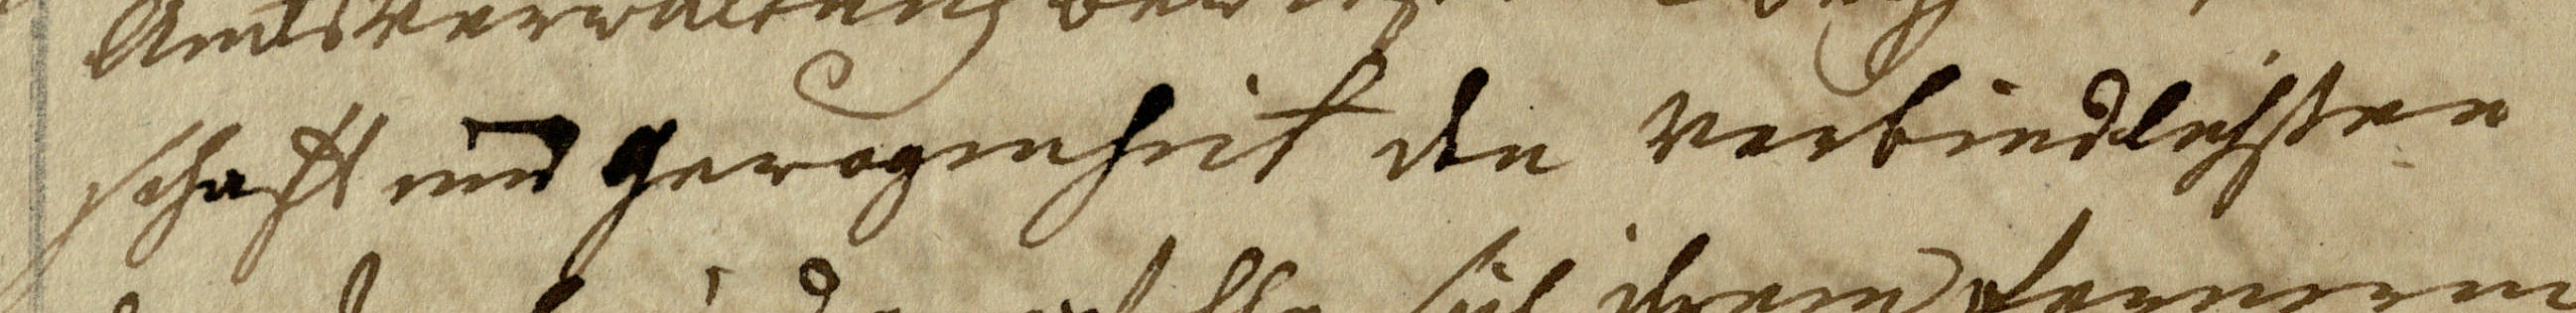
schaft und Gewogenheit den verbindlichsten
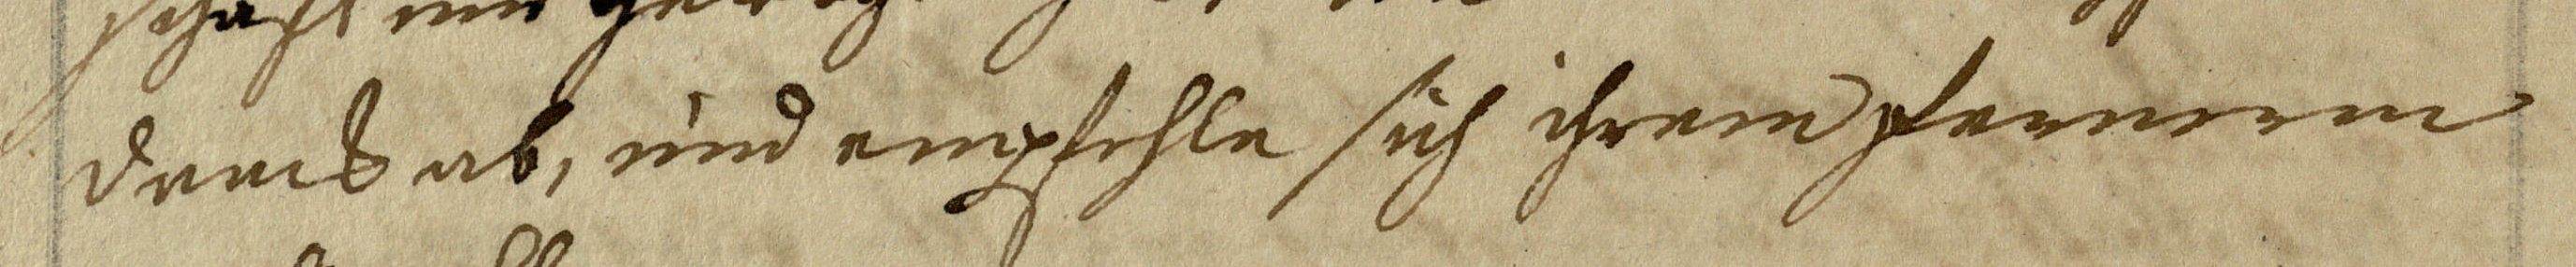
Danck ab, und empfehle sich ihrem fernerm
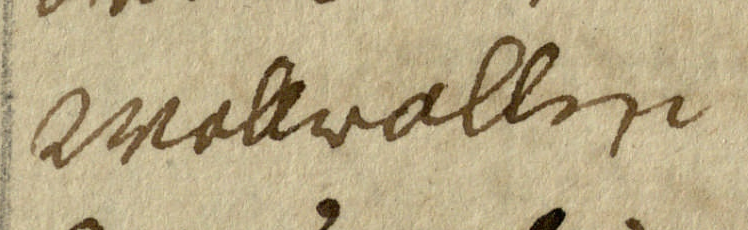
Wollwollen
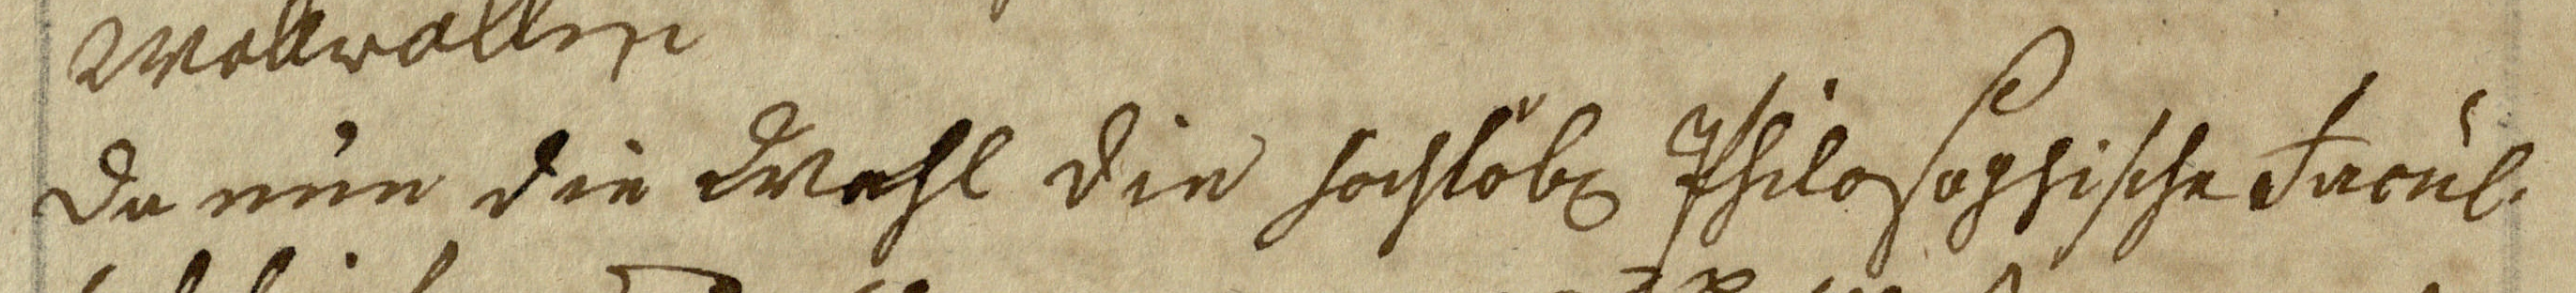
Da nun die Wahl die hochlöb. Philosophische Facul¬
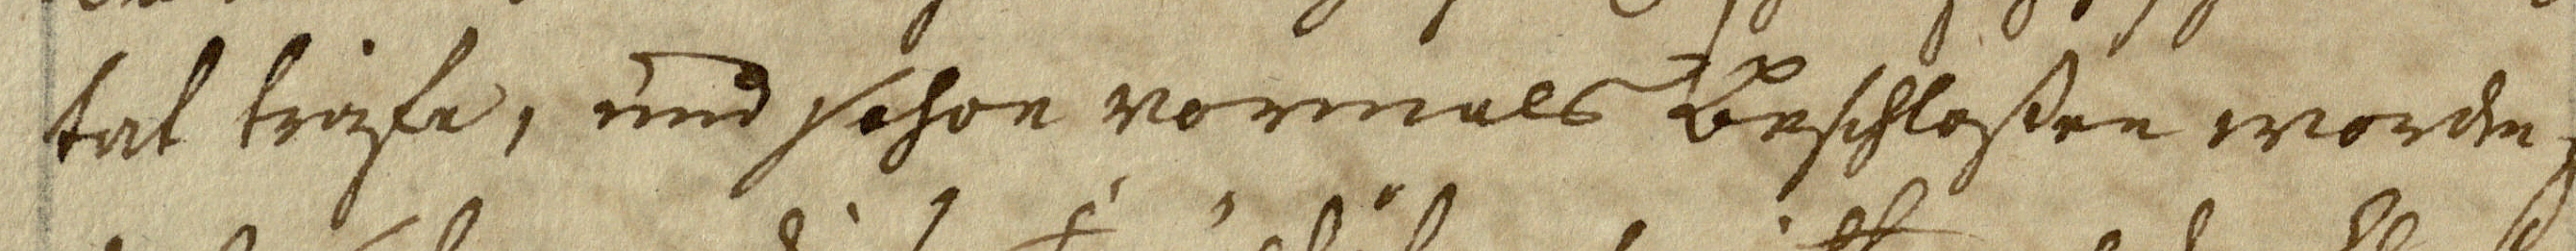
tat träfe, und schon vormals beschloßen worden,
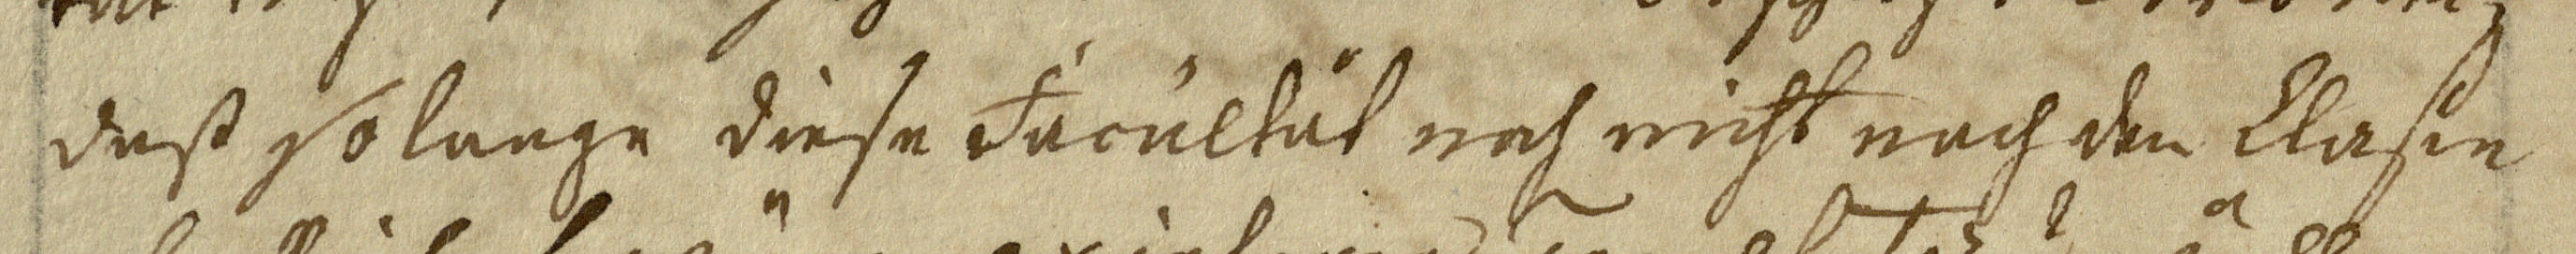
daß so lange diese Facultät noch nicht nach den Claßen
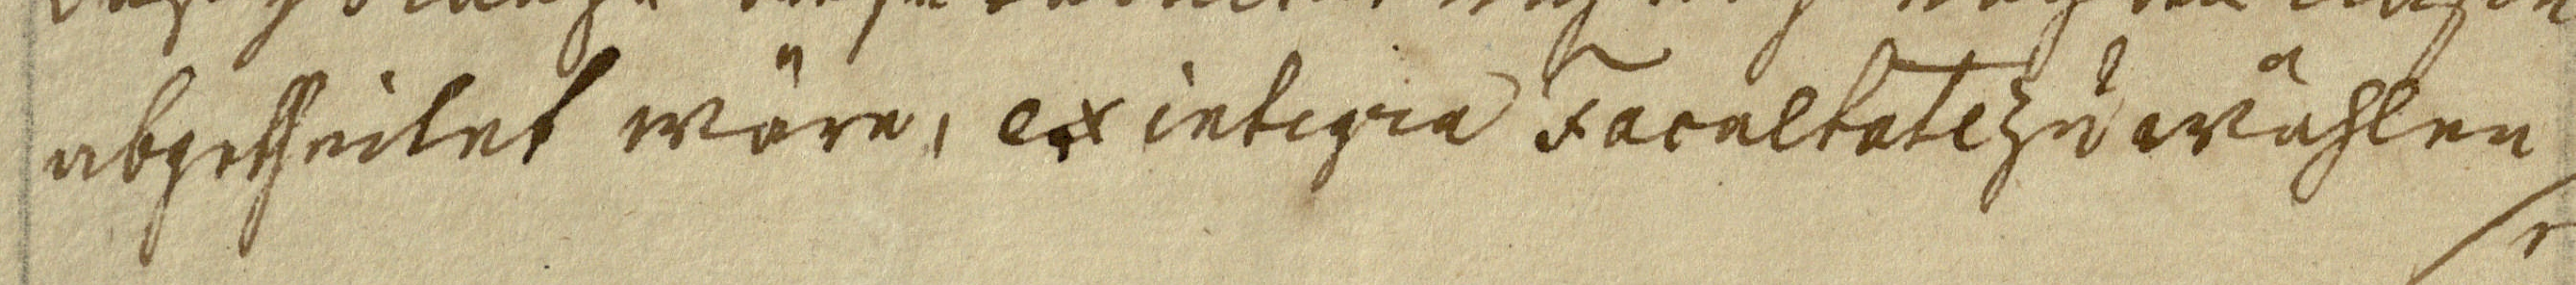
abgetheilet wäre, ex integra Facultate zu wählen
